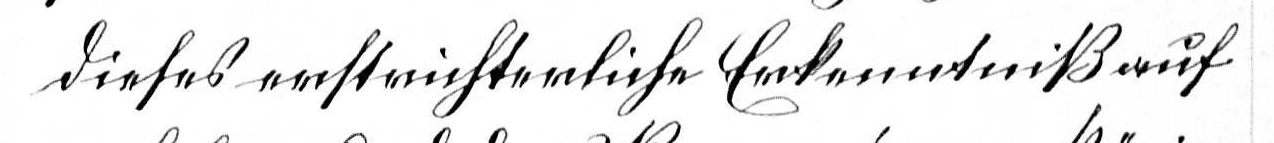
dieses erstrichterliche Erkenntniß auf
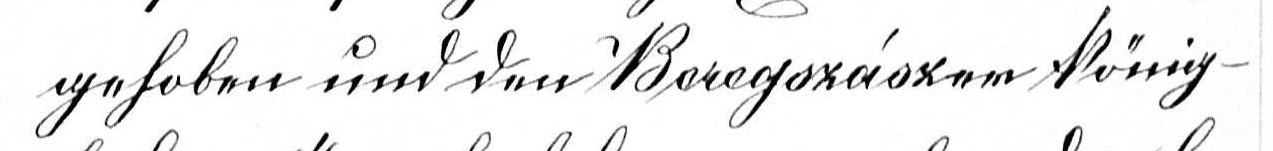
gehoben und den Beregszászer könig¬
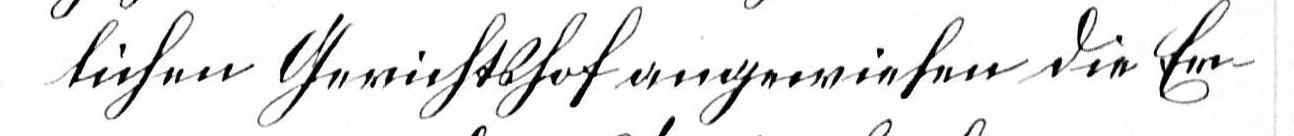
lichen Gerichtshof angewiesen die Er¬
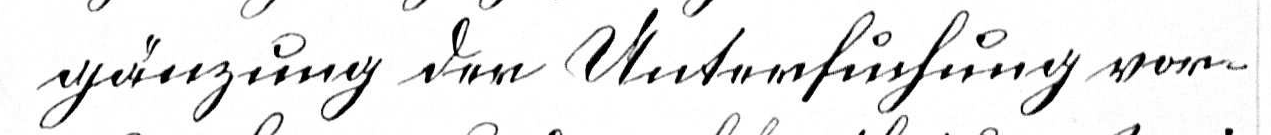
gänzung der Untersuchung vor¬
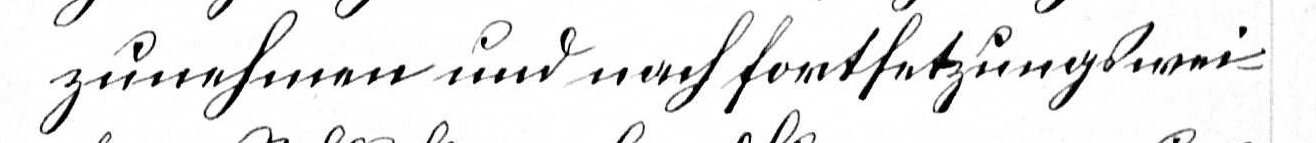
zunehmen und nach fortsetzungswei¬
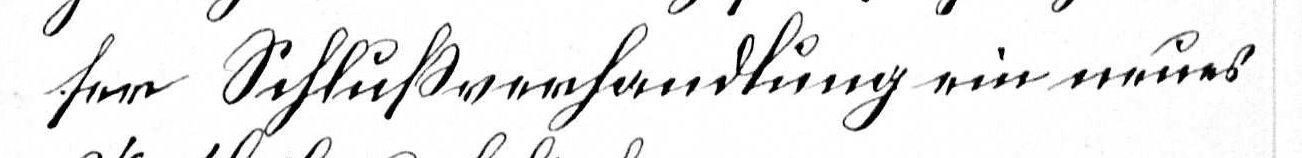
fer Schlußverhandlung ein neues
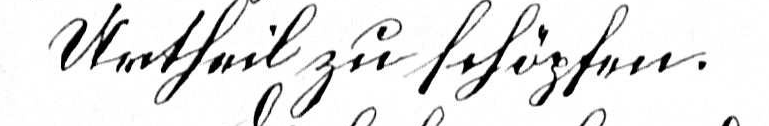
Urtheil zu schöpfen.
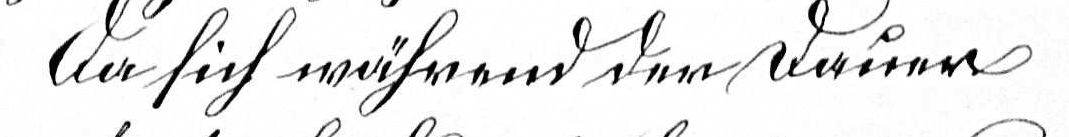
Da sich während der Dauer
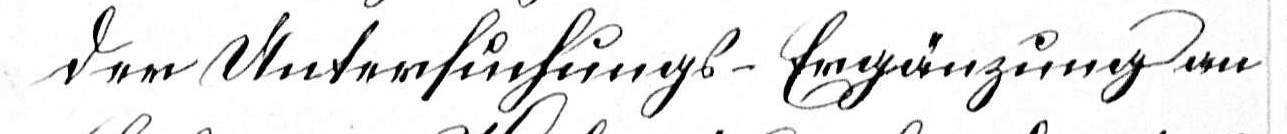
der Untersuchungs-Ergänzung an
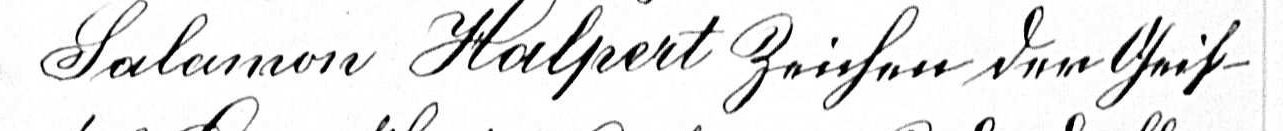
Salamon Halpert Zeichen der Geis¬
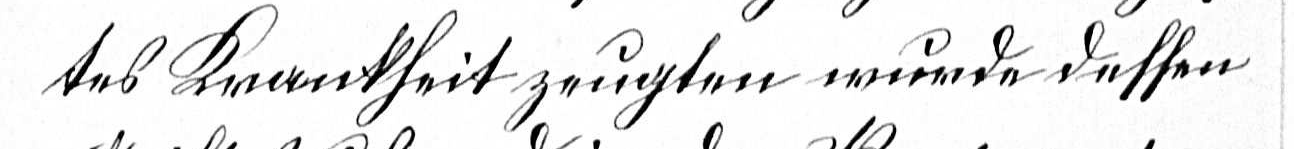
tes Krankheit zeugten wurde dessen
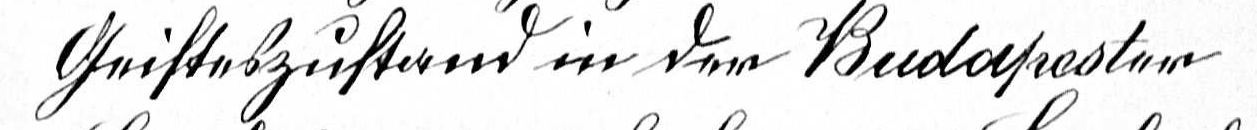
Geisteszustand in der Budapester
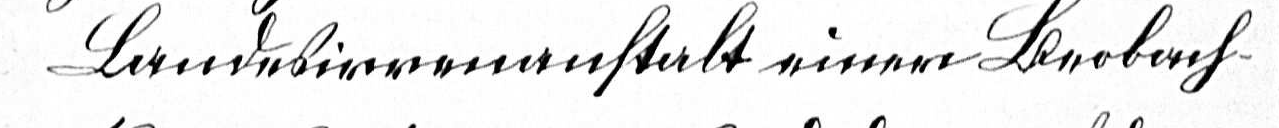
Landesirrenanstalt einer Beobach¬
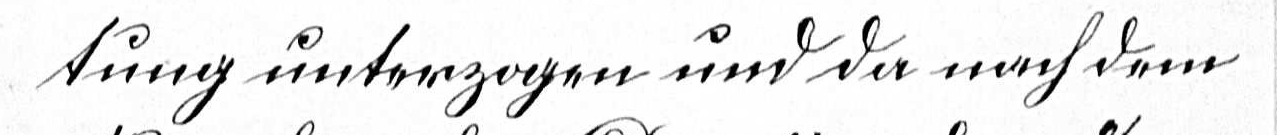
tung unterzogen und da nach dem
